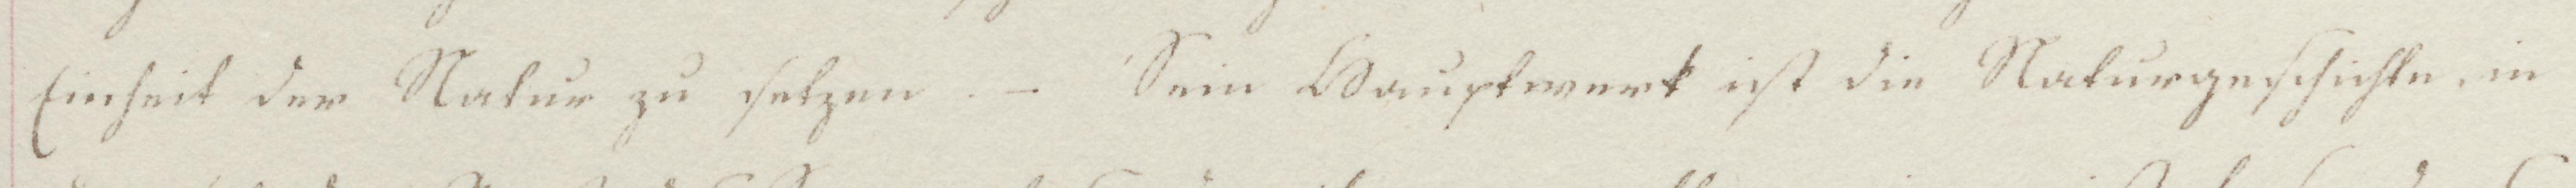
Einheit der Natur zu setzen. – Sein Hauptwerk ist die Naturgeschichte, in
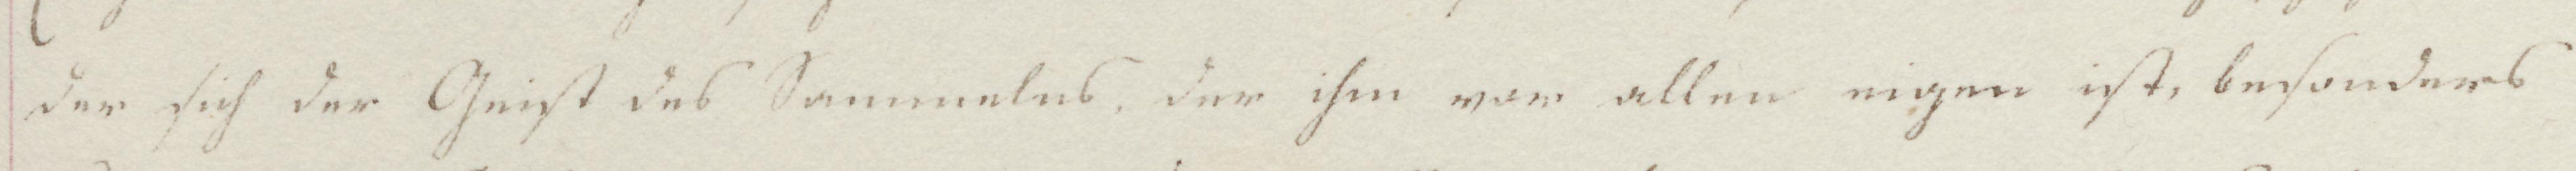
der sich der Geist des Sammelns, der ihm vor allen eigen ist, besonders
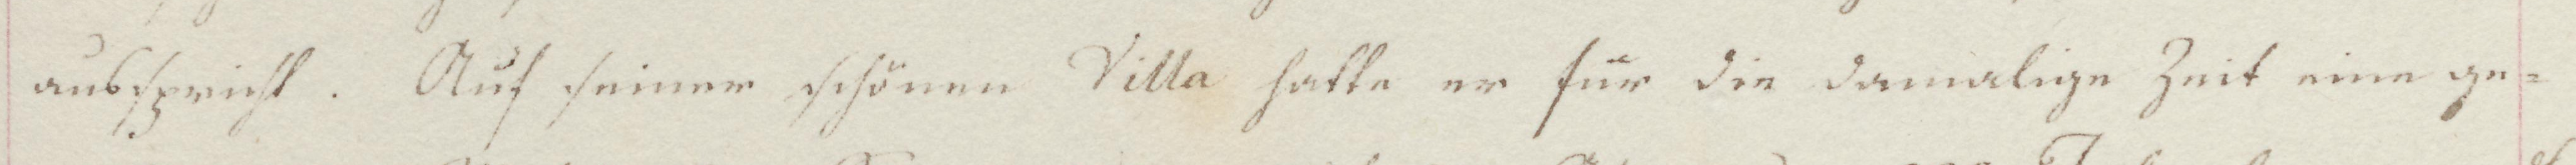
ausspricht. Auf seiner schönen Villa hatte er für die damalige Zeit eine ge-
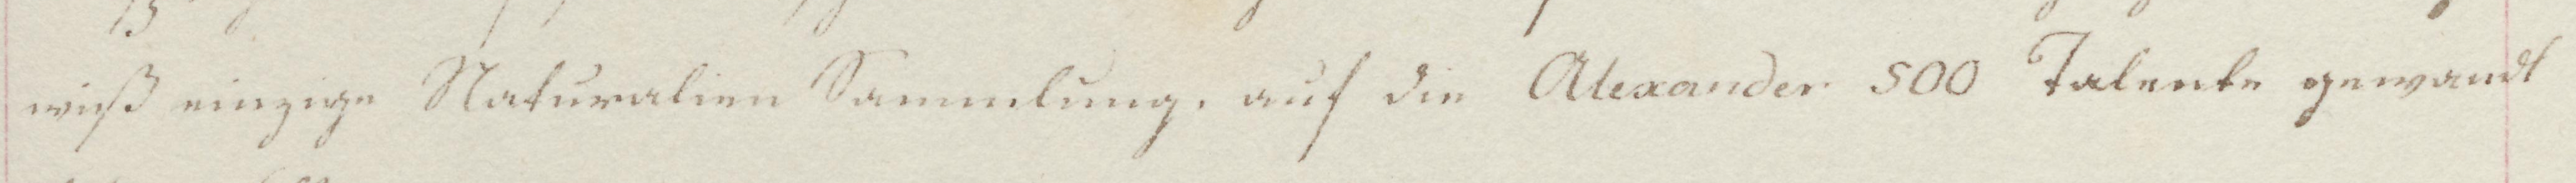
wiß einzige Naturalien Sammlung, auf die Alexander 500 Talente gewandt
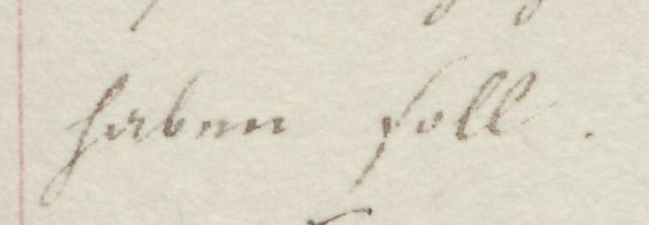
haben soll.
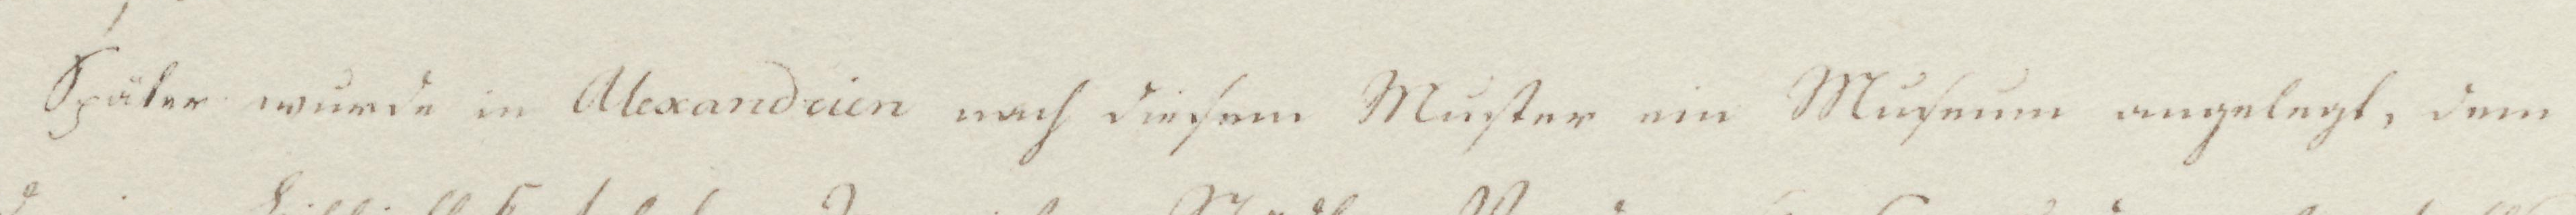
Später wurde in Alexandrien nach diesem Muster ein Museum angelegt, dem
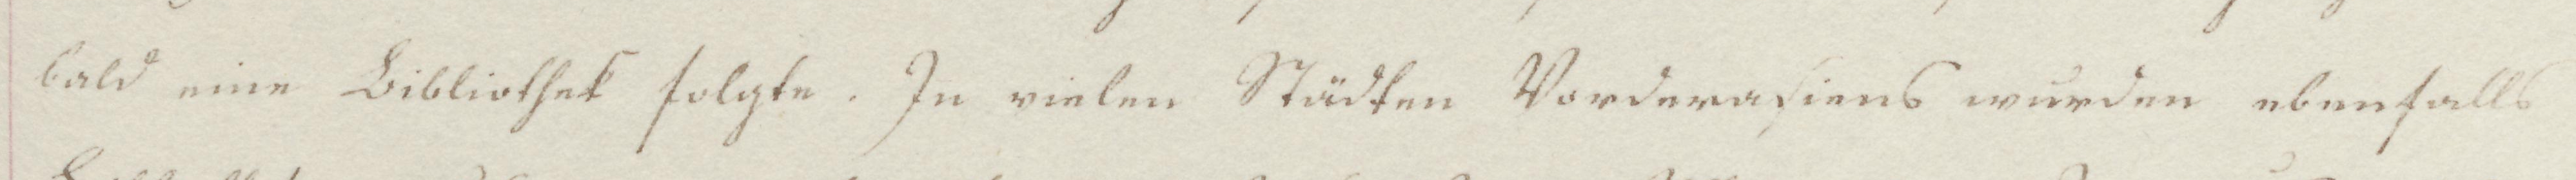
bald eine Bibliothek folgte. In vielen Städten Vorderasiens wurden ebenfalls
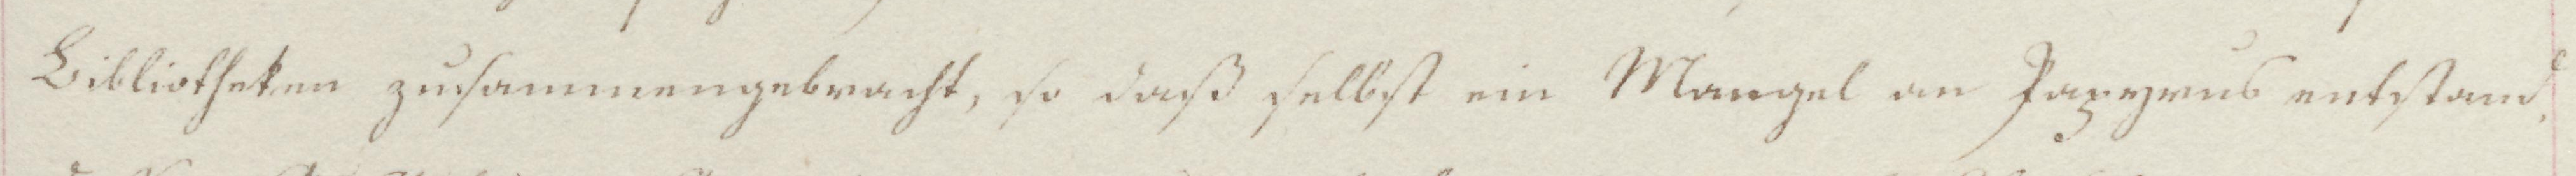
Bibliotheken zusammengebracht, so daß selbst ein Mangel an Papyrus entstand,
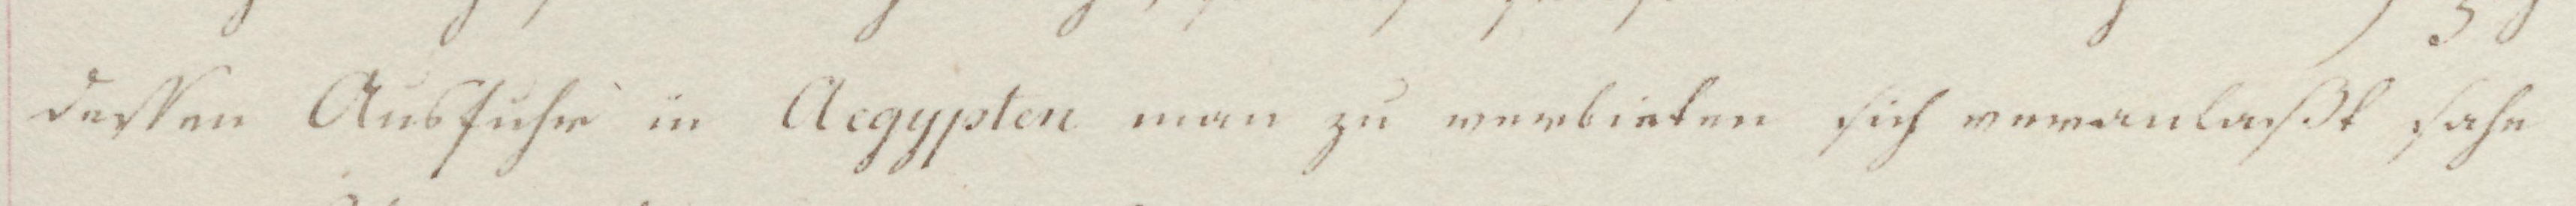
dessen Ausfuhr in Aegypten man zu verbieten sich veranlaßt sahe.
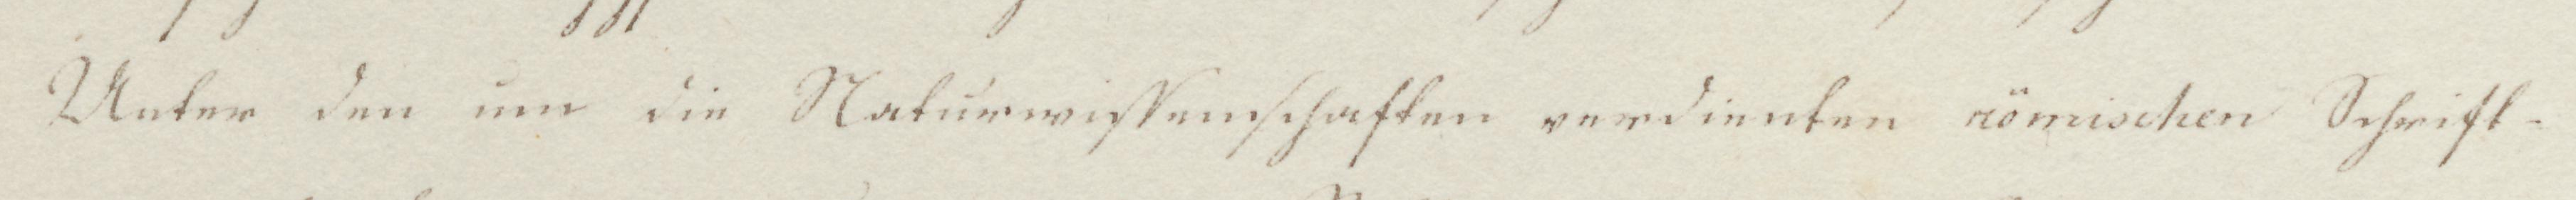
Unter den um die Naturwissenschaft verdienten römischen Schrift-
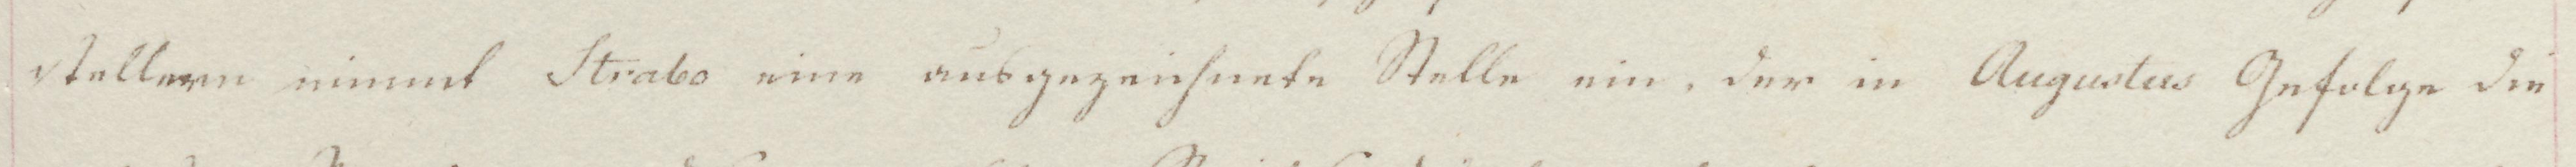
stellern nimmt Strabo eine ausgezeichnete Stelle ein, der in Augustus Gefolge die
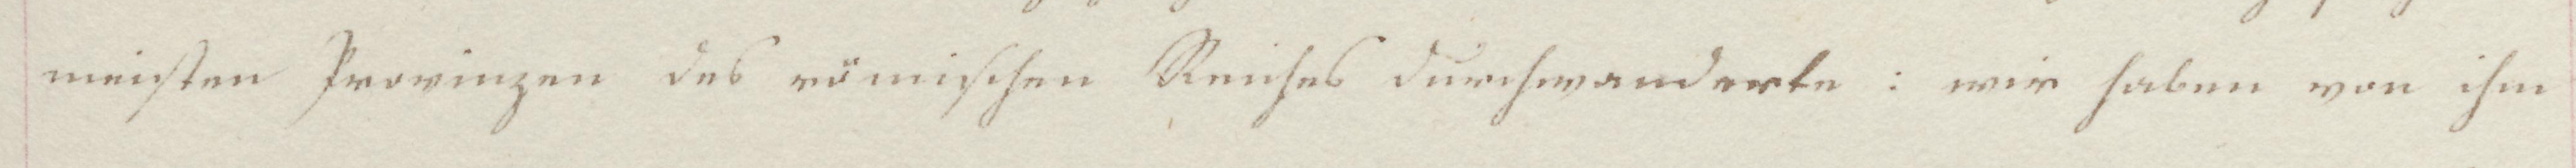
meisten Provinzen des römischen Reiches durchwanderte: wir haben von ihm
